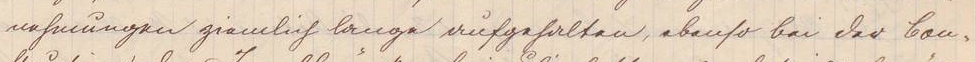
nehmungen ziemlich lange aufgehalten, ebenso bei der Con-
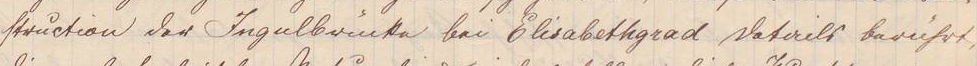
struction der Ingulbrücke bei Elisabethgrad Details berührt,
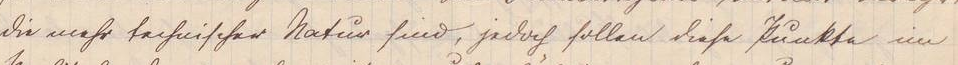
die mehr technischer Natur sind, jedoch sollen diese Punkte im
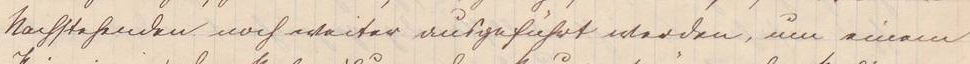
Nachstehenden noch weiter ausgeführt werden, um einem
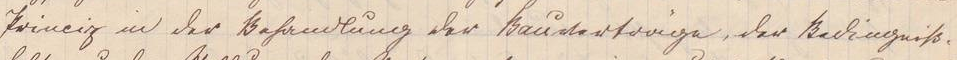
Princip in der Behandlung der Bauverträge, der Bedingniß-
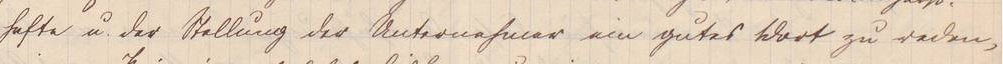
hefte u. der Stellung der Unternehmer ein gutes Wort zu reden,
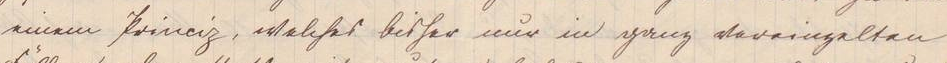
einem Princip, welches bisher nur in ganz vereinzelten
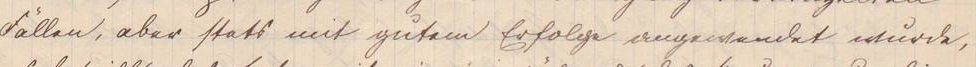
Fällen, aber stets mit gutem Erfolge angewandt wurde,
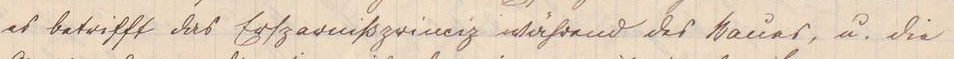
es betrifft das Ersparnißprincip während des Baues, u. die
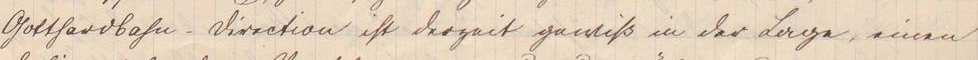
Gotthardbahn-Direction ist derzeit gewiß in der Lage, einen
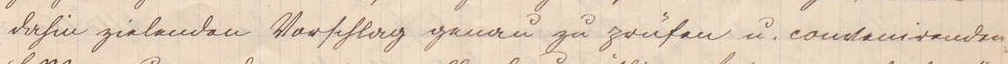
dahin zielenden Vorschlag genau zu prüfen u. convenirenden-
